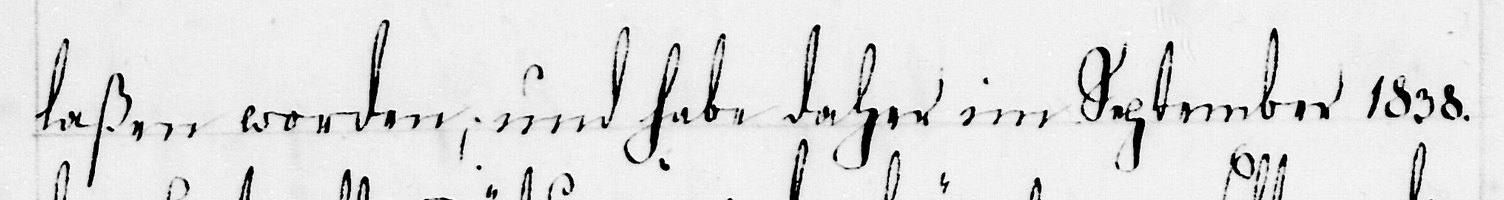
laßen worden, und habe daher im September 1838.
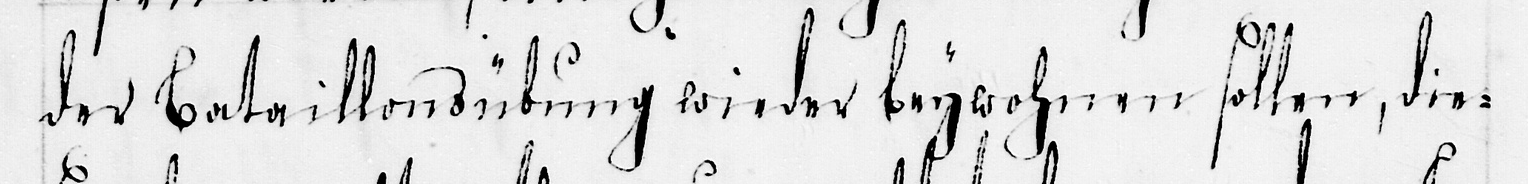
der Bataillonsübung wieder beywohnen sollen, die¬
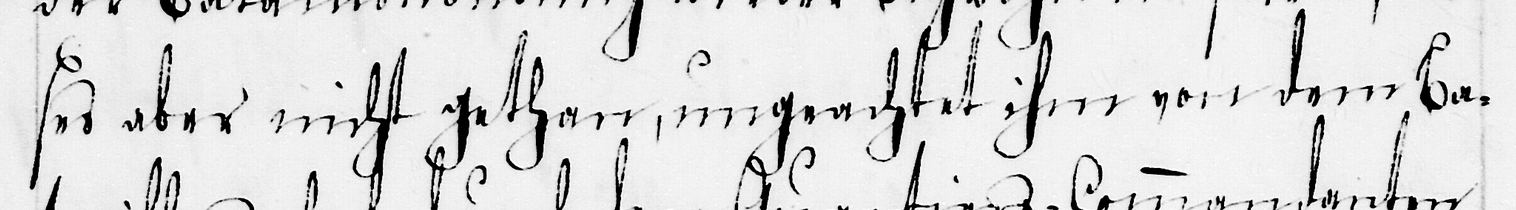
ses aber nicht gethan, ungeachtet ihm von dem Ba¬
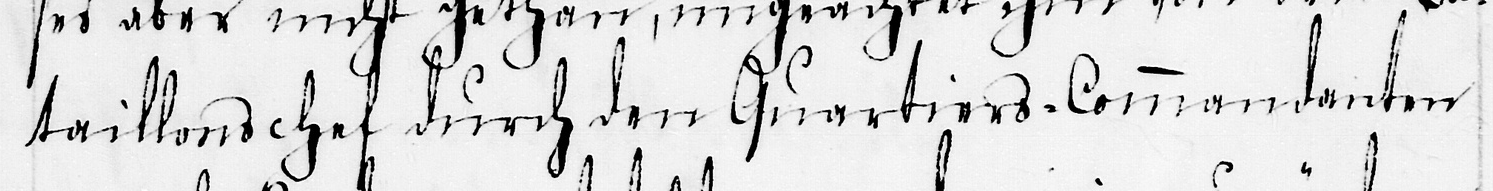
taillonschef durch den Quartiers-Commandanten
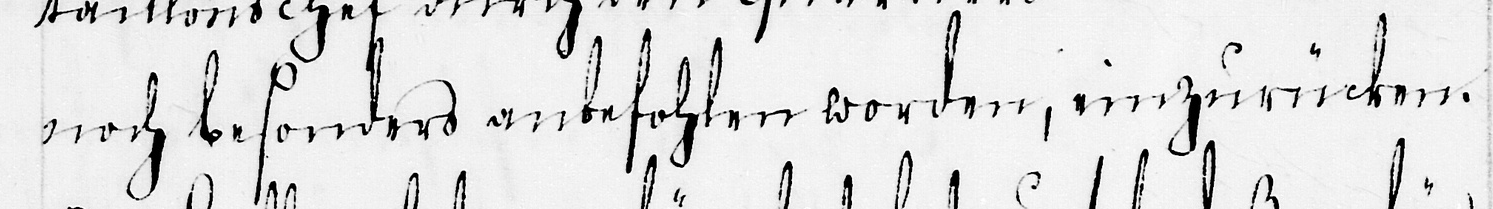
noch besonders anbefohlen worden, einzurücken.
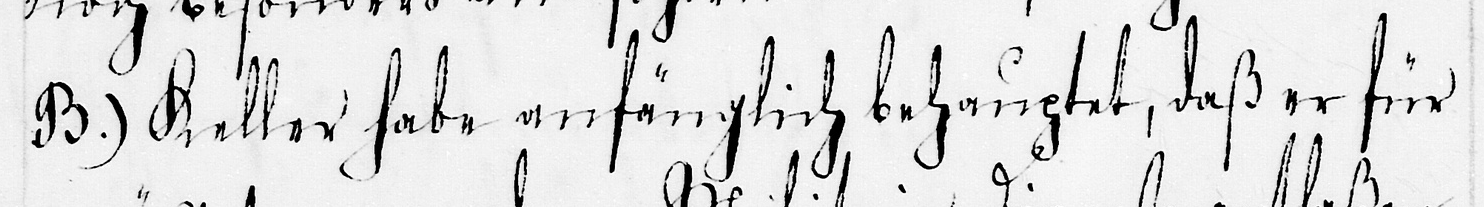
B.) Keller habe anfänglich behauptet, daß er für
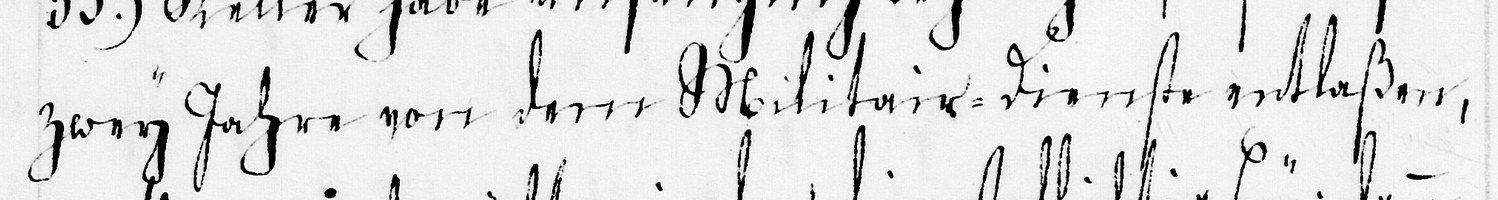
zwey Jahre von dem Militair-Dienste entlaßen,
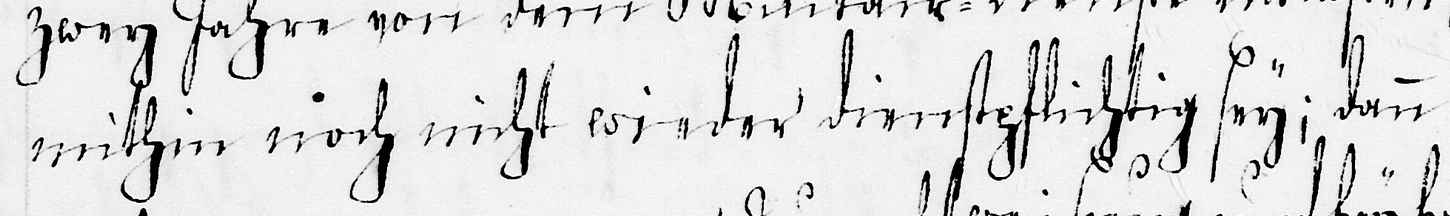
mithin noch nicht wieder dienstpflichtig sey; dan¬
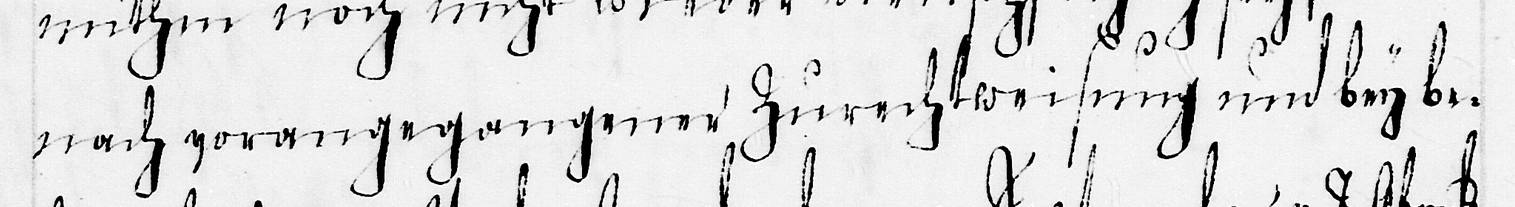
nach vorangegangener Zurechtweisung und bey be¬
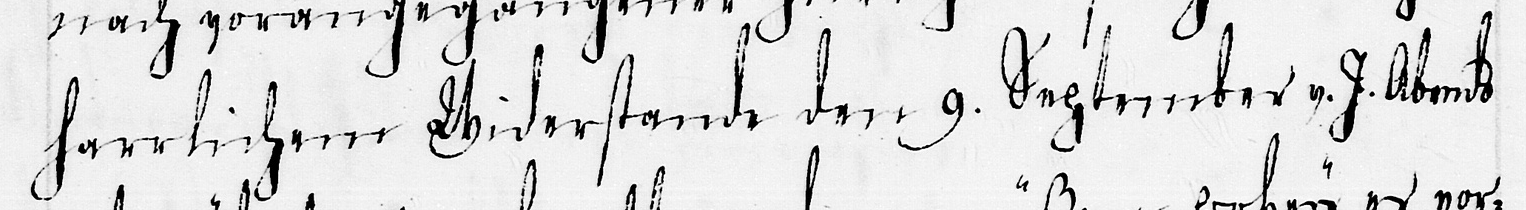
harrlichem Widerstande den 9. September v. J. Abends
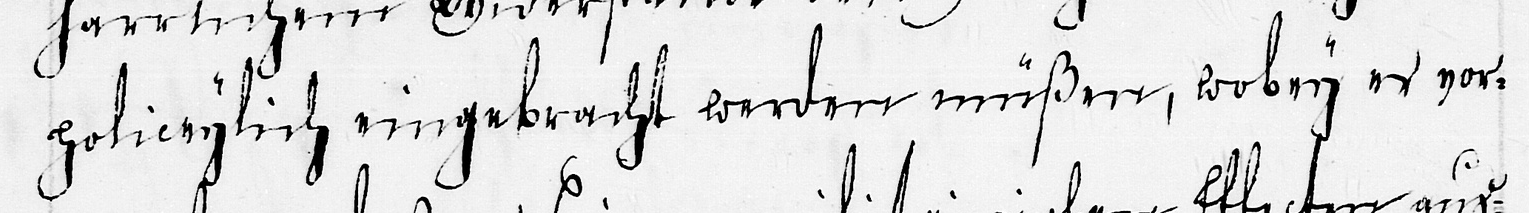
policeylich eingebracht werden müßen, wobey er vor¬
